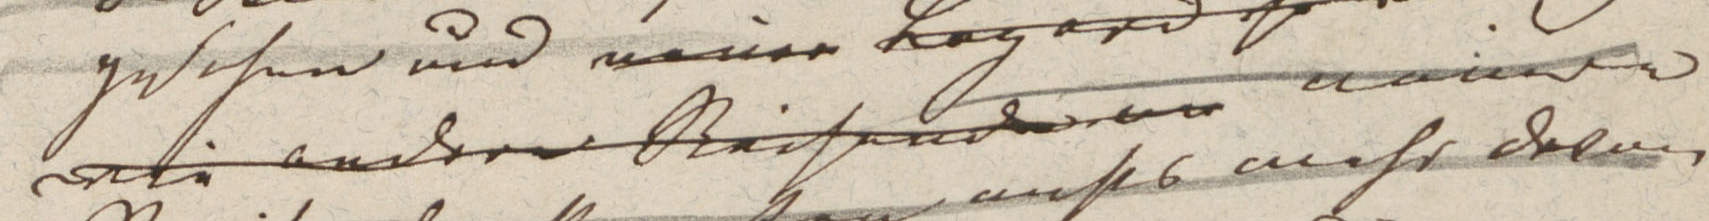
wie andere Reisende neuere
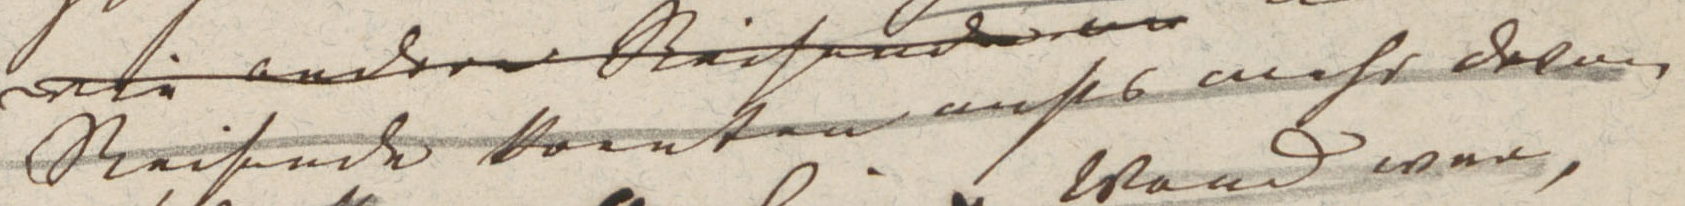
Reisende konnten nichts mehr davon
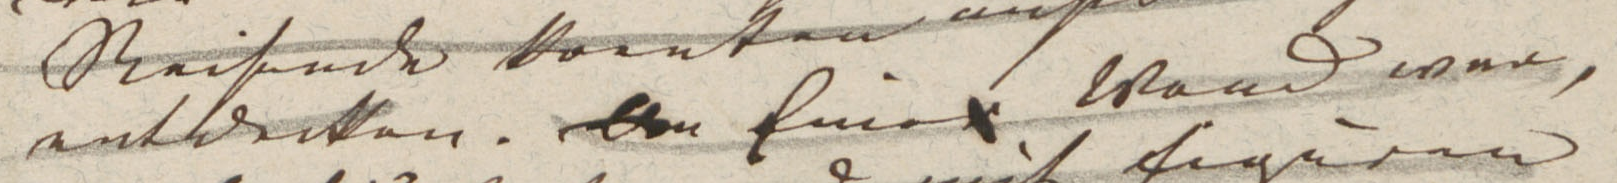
entdecken. An Einer Wand war,
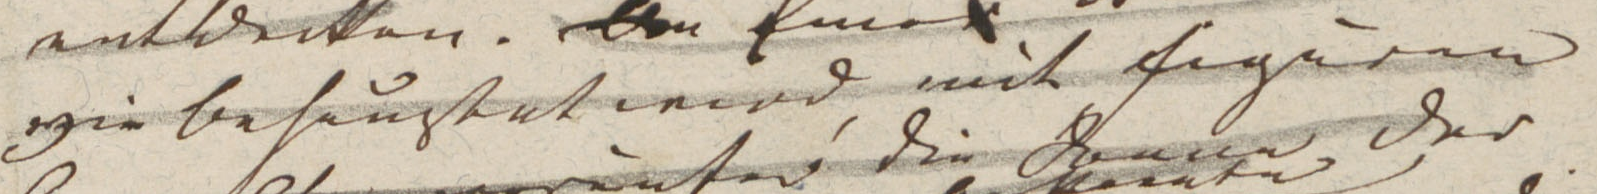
wie behauptet wird, mit Figuren
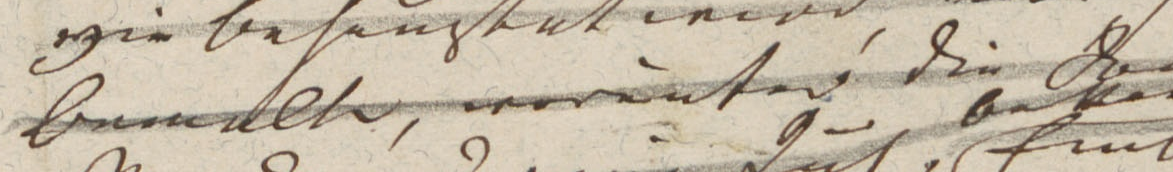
bemalt, worunter die Sonne
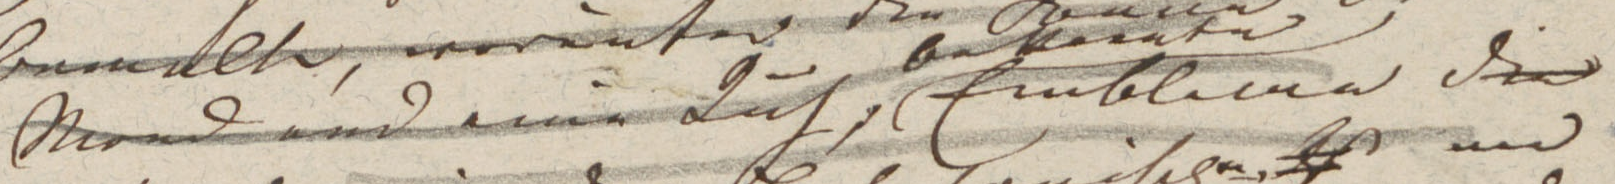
Mond und eine Kuh, bekannte Emblema die
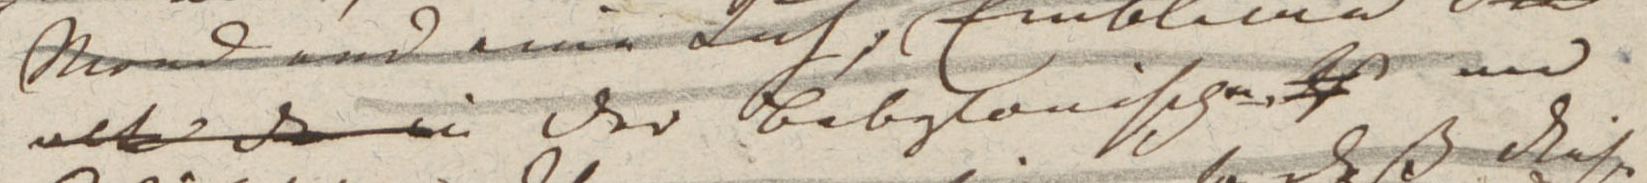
alt d in der Babylonischen Sch und
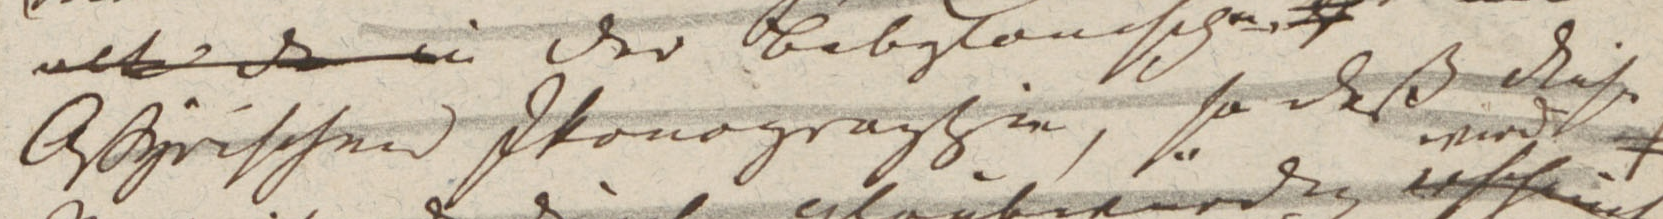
Assyrischen Ikonographie, so dass diese
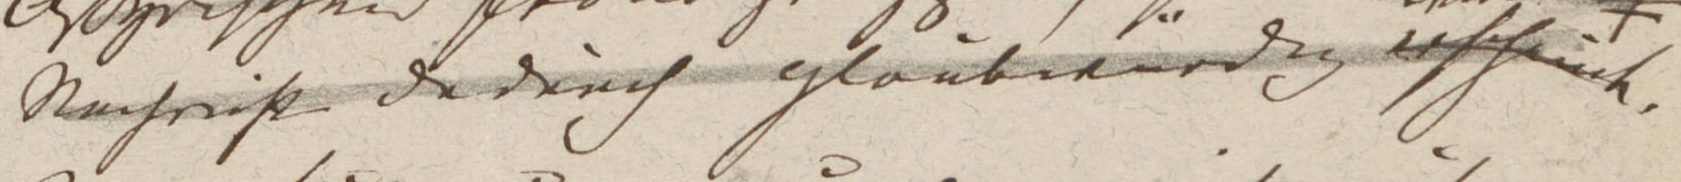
Nachricht dadurch glaubwürdig erscheint.
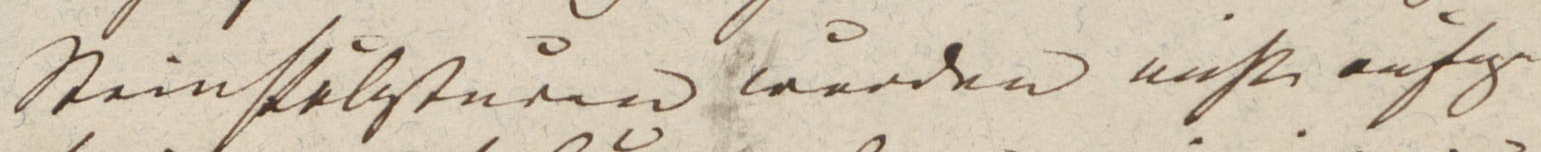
Steinskulpturen wurden nicht aufge-
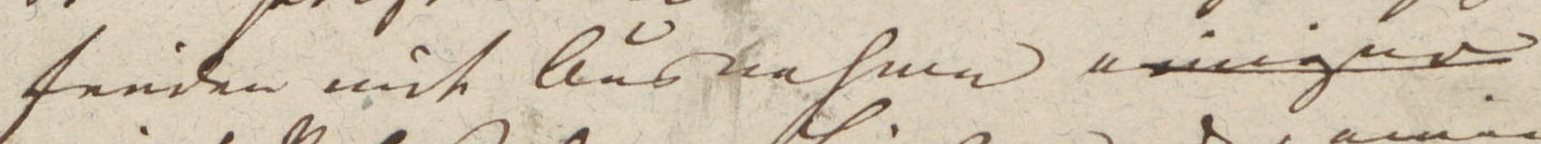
funden mit Ausnahme einiger
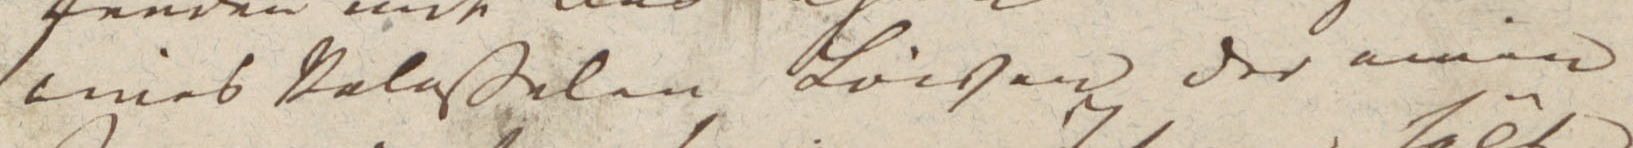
eines kolossalen Löwen der einen
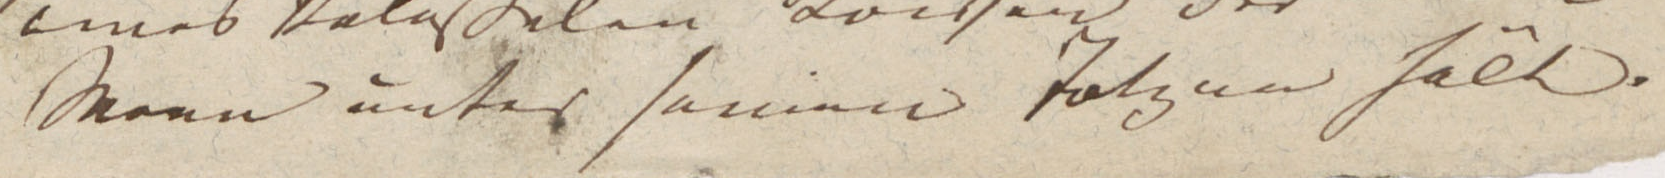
Mann unter seinen Tatzen hält.
